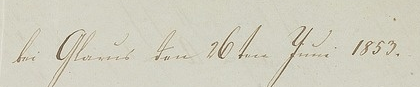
bei Glarus den 26ten Juni 1853.
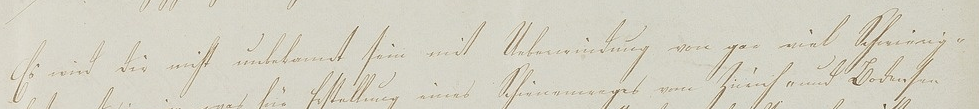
Es wird Dir nicht unbekannt sein mit Ueberwindung von gar viel Schwierig-
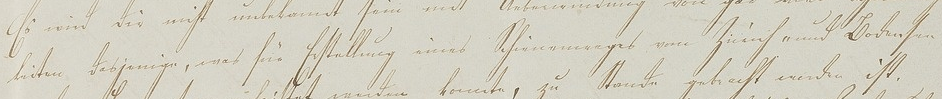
keiten dasjenige, für Erstellung eines Schienenweges vom Zürich- und Bodensee
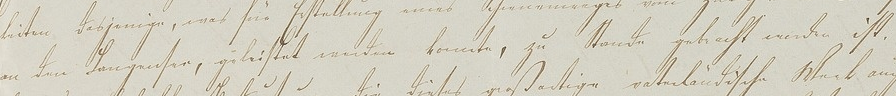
an den Langensee, geleistet werden konnte, zu Stande gebracht worden ist.
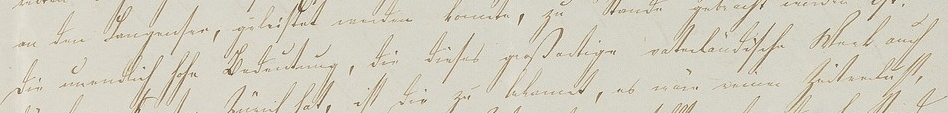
Die unendlich hohe Bedeutung, die dieses großartige vaterländische Werk auch
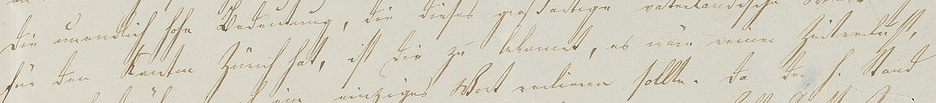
für den Kanton Zürich hat, ist Dir zu bekannt, es wäre reiner Zeitverlust,
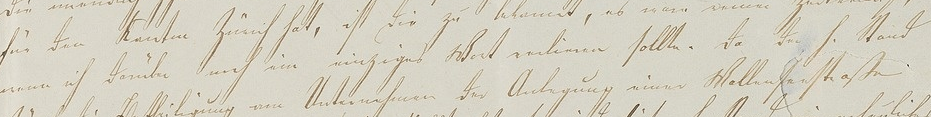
wenn ich darüber noch ein einziges Wort verlieren sollte. Da der h. Stand
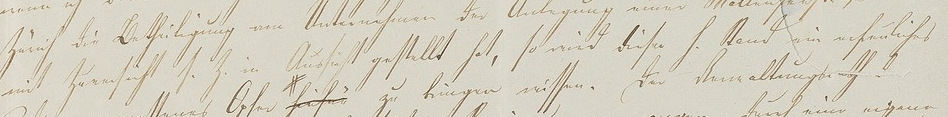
mit Zuversicht s. Z. in Aussicht gestellt hat, so wird dieser h. Stand ein erfreuliches
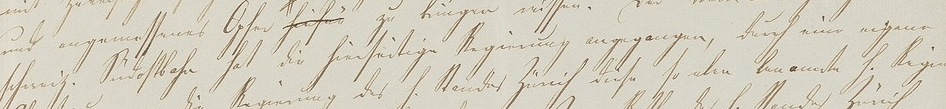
schweiz. Südostbahn hat die hierseitige Regierung angegangen, durch eine eigene
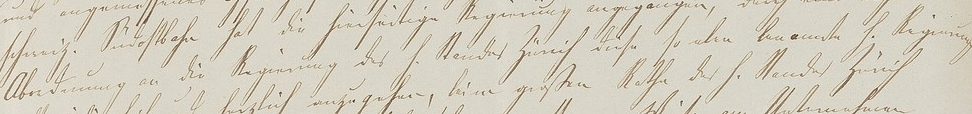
Abordnung an die Regierung des h. Standes Zürich diese so eben benannte h. Regierung
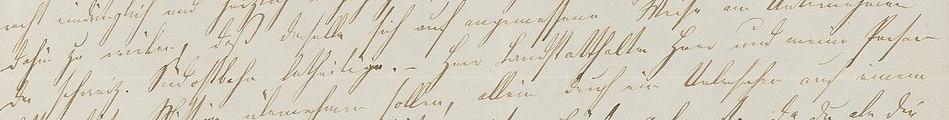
der schweiz. Südostbahn betheilige. – Herr Landstatthalter Heer und meine Person
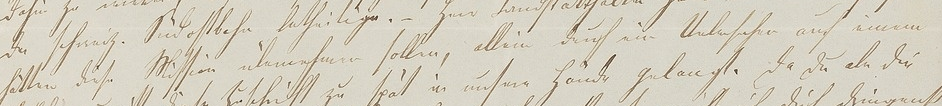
hätten diese Mission übernehmen sollen, allein durch ein Uebersehen auf einem
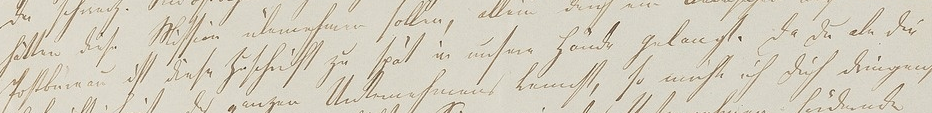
Postbüreau ist diese Zuschrift zu spät in unsere Hände gelangt. Da Du aber die
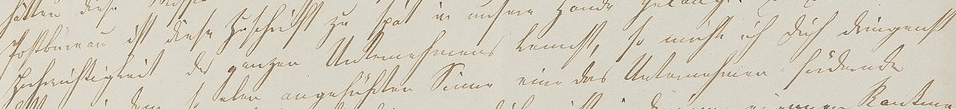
Schwierigkeit des ganzen Unternehmens kennst, so möchte ich Dich dringenst
